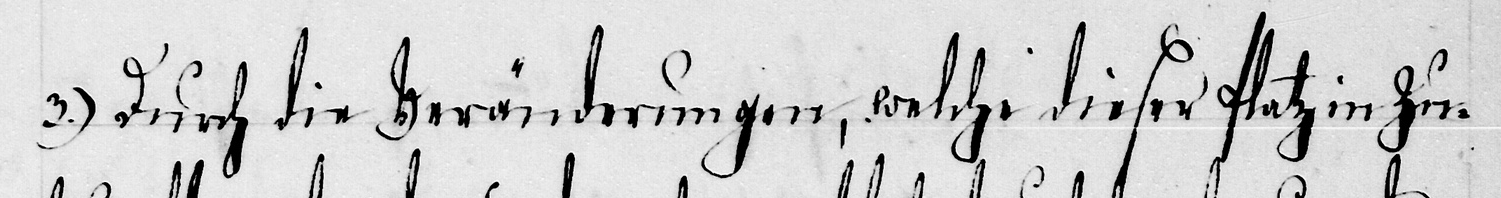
3.) Durch die Veränderungen, welche dieser Platz in Zu¬
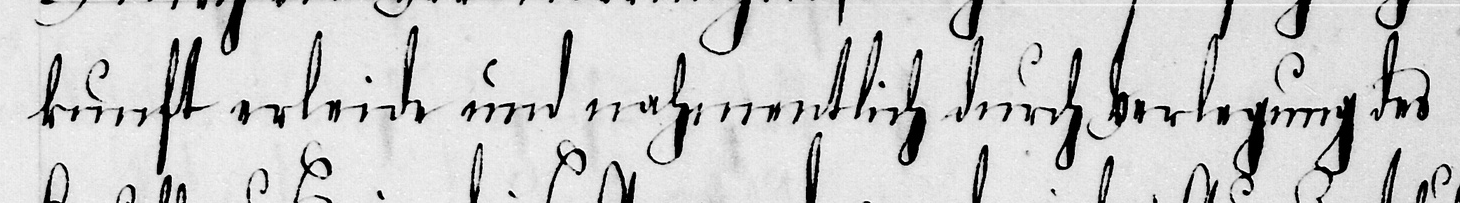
kunft erleide und nahmentlich durch Verlegung des
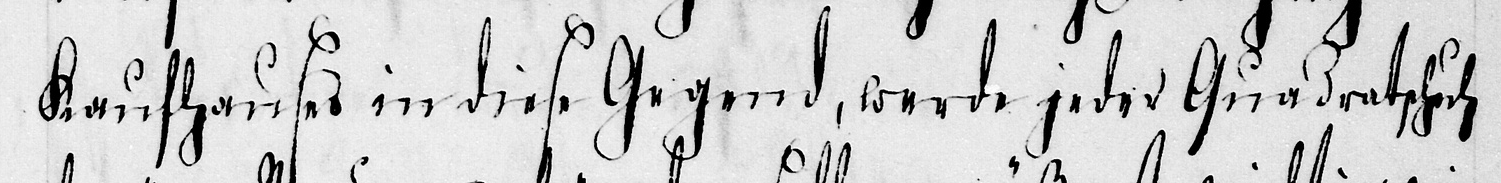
Kaufhauses in diese Gegend, werde jeder Quadratschuh
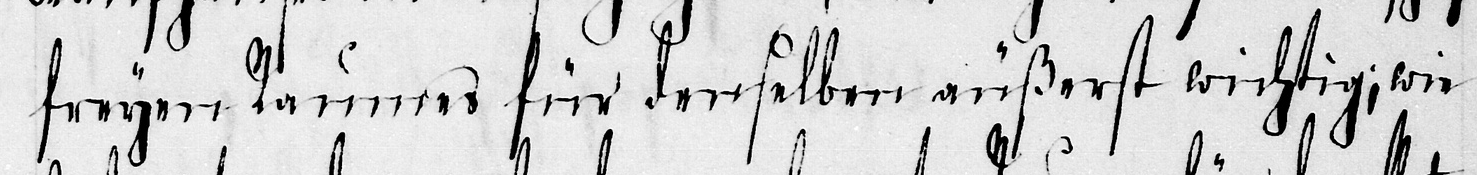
freyen Raumes für denselben äußerst wichtig; wie
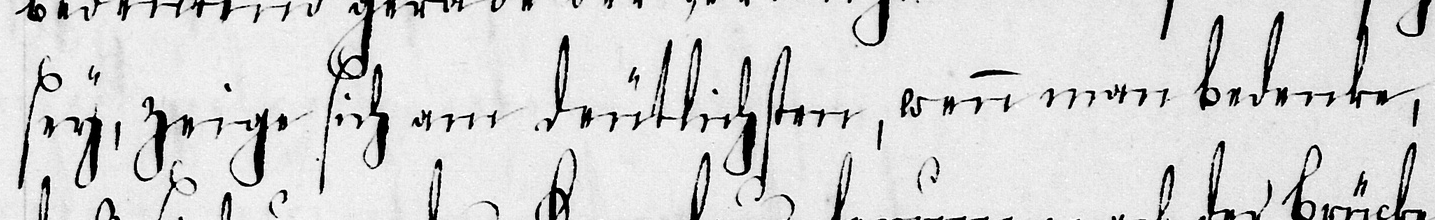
sey, zeige sich am deutlichsten, wenn man bedenke,
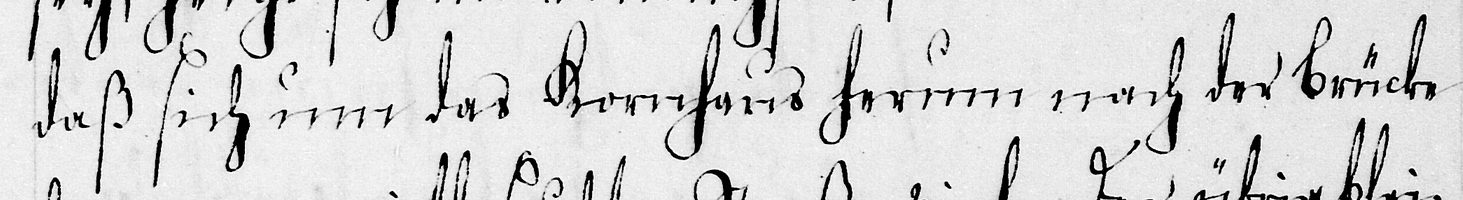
daß sich um das Kornhaus herum nach der Brücke
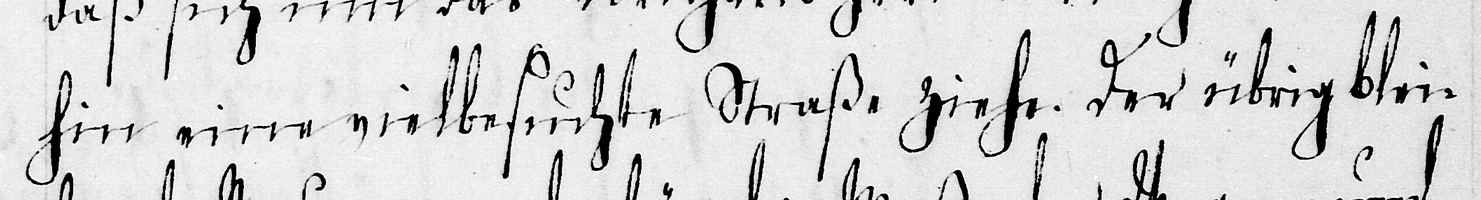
hin eine vielbesuchte Straße ziehe. Der übrig blei¬
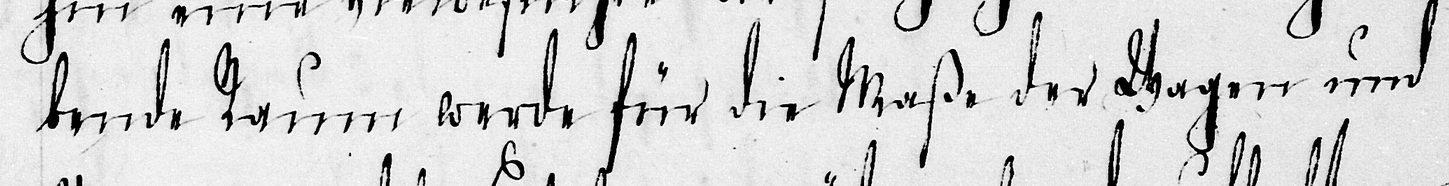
bende Raum werde für die Maße der Wagen und
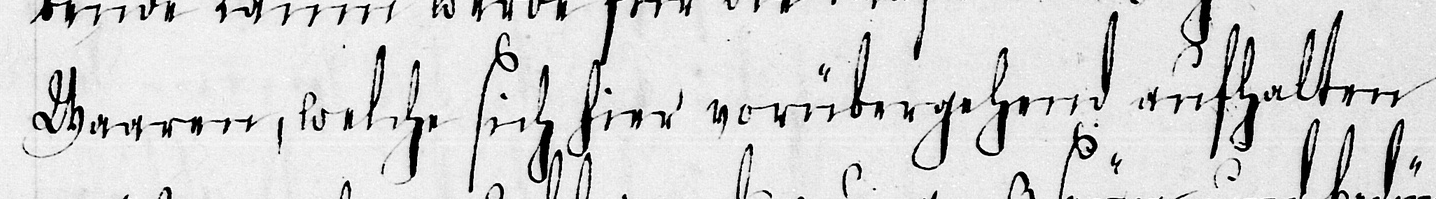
Waaren, welche sich hier vorübergehend aufhalten
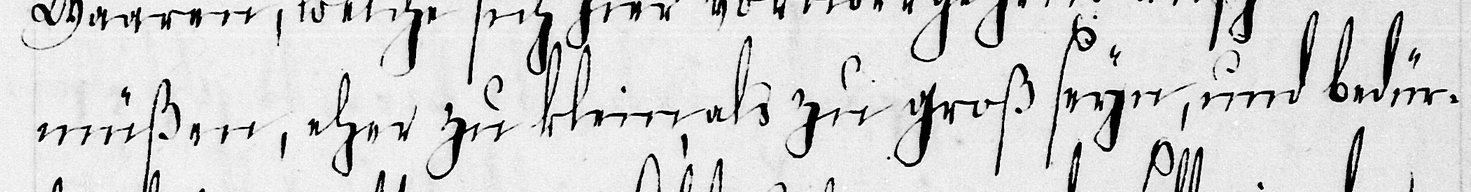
müßen, eher zu klein, als zu groß seyn, und bedür¬
